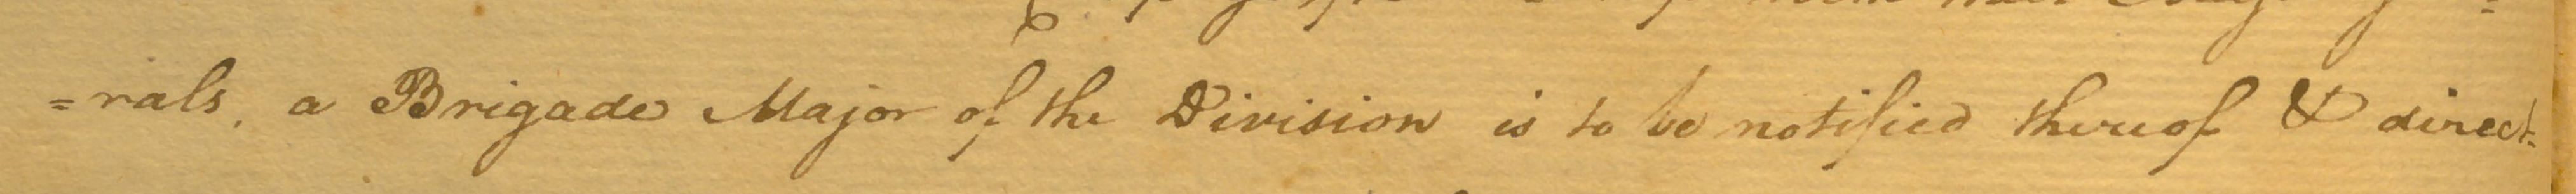-rals, a Brigade Major of the Division is to be notified thereof & direct-
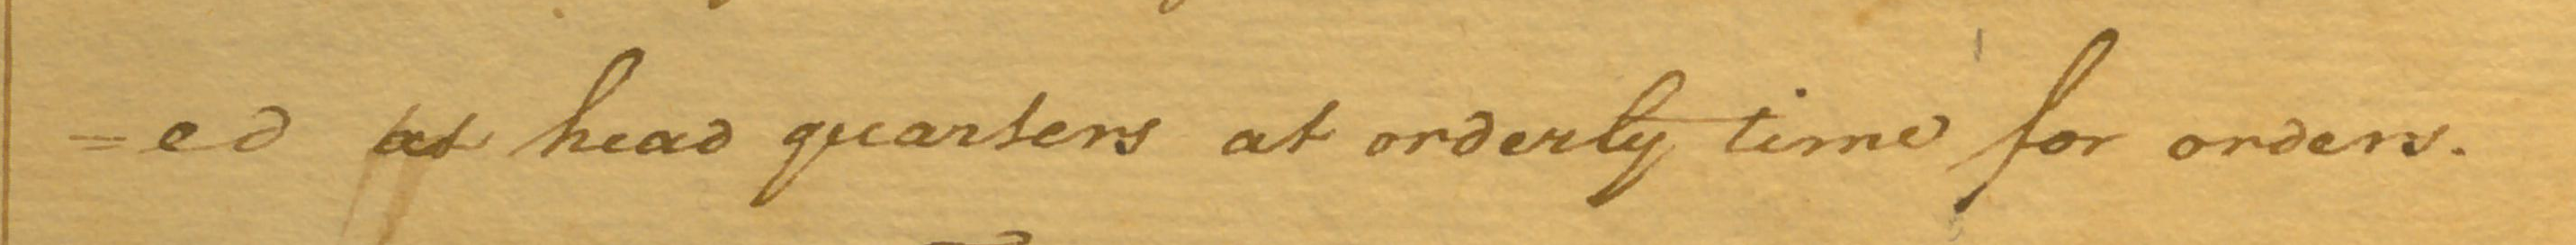-ed at head quarter at orderly time for orders.
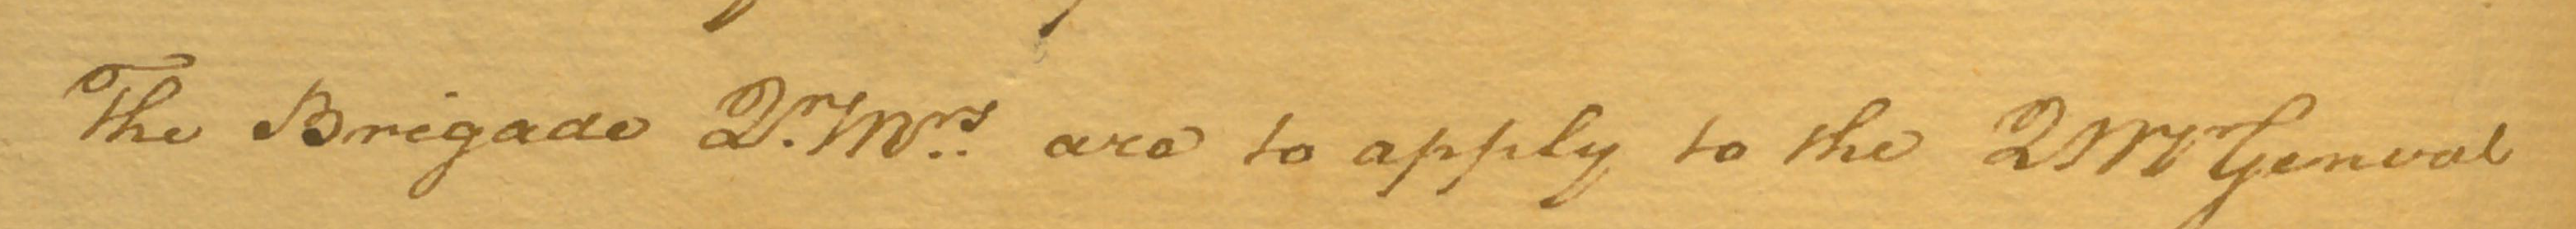The Brigade Q^r. M^rs. are to apply to the Q M General
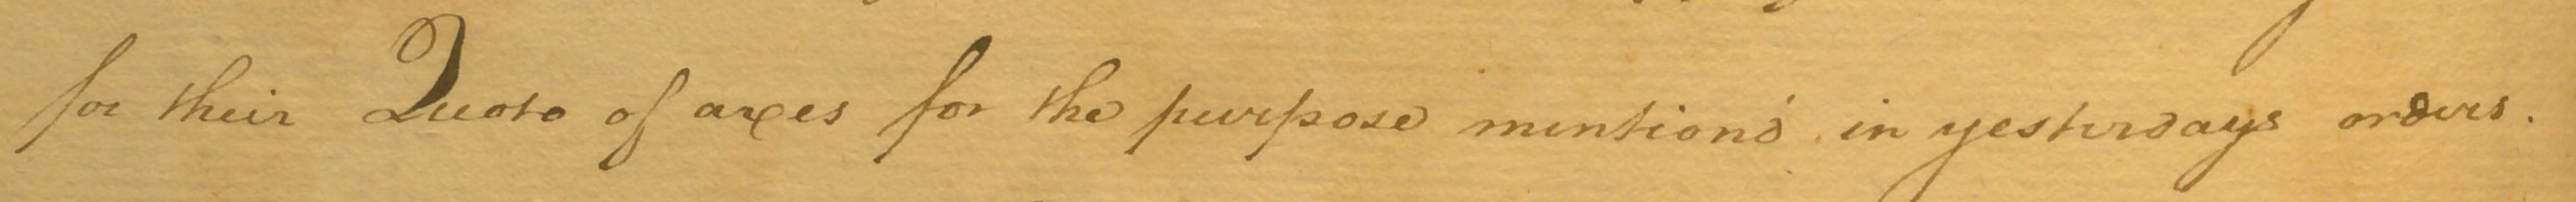for their Quota of axes for the purpose mention'd in yesterdays orders.
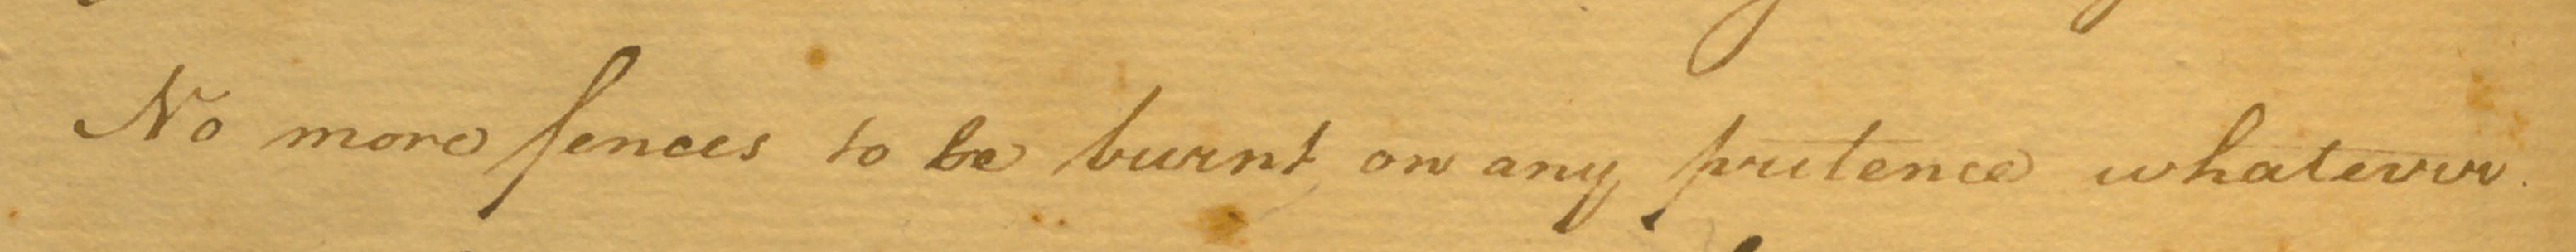No more fences to be burnt on any pretence whatever
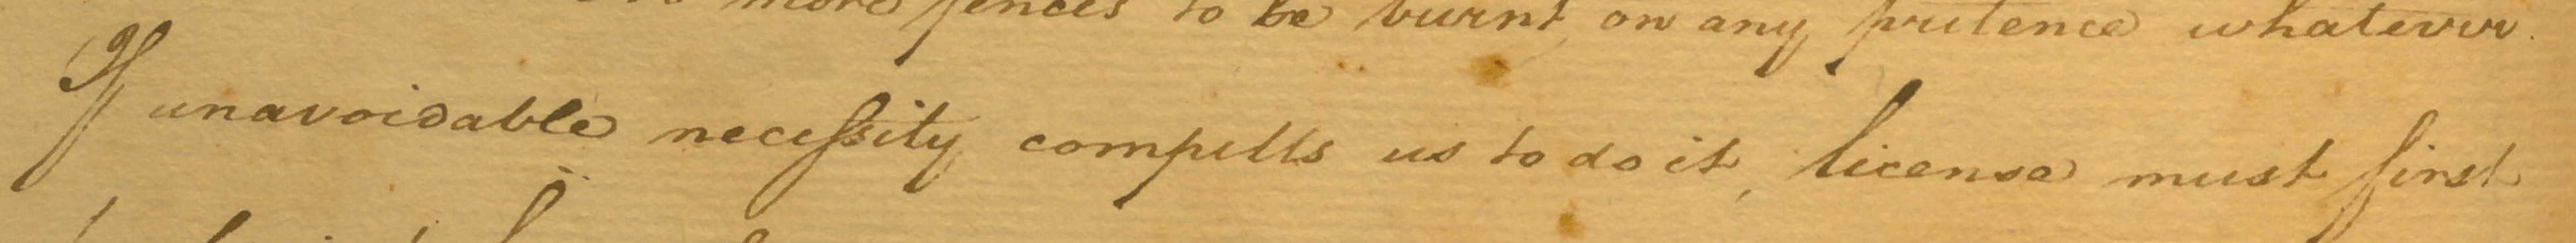If unavoidable necessity compells us to do it, license must first
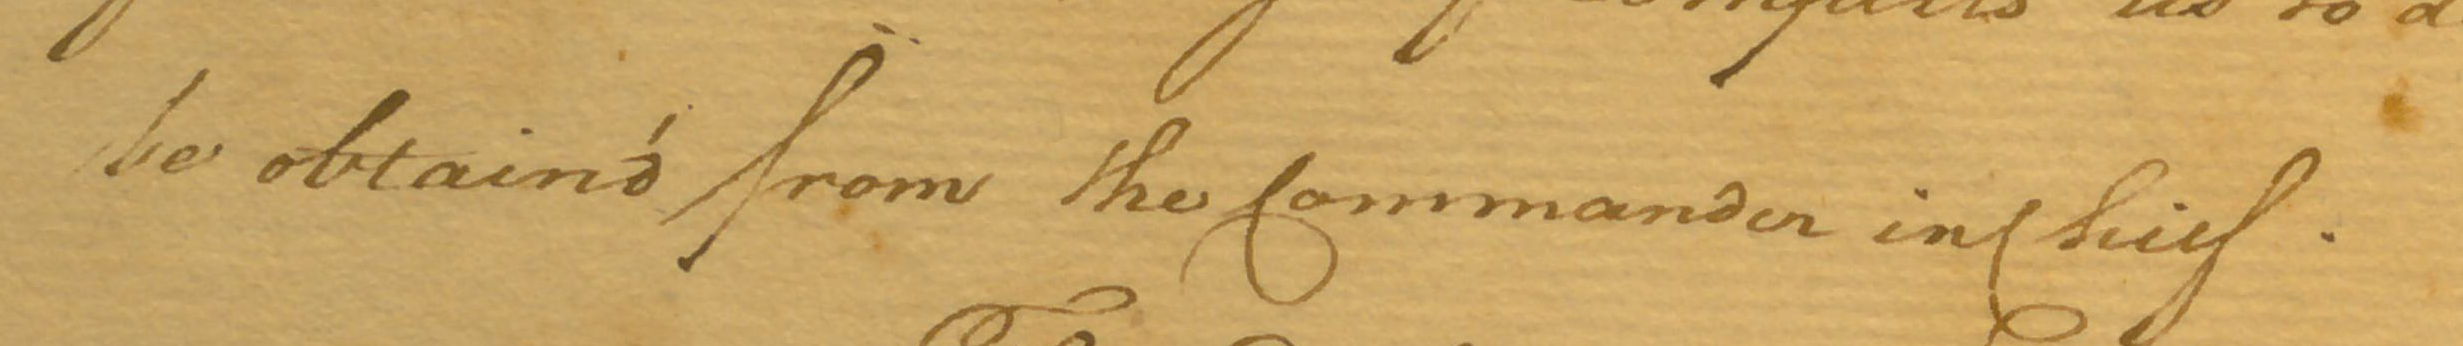be obtain'd from the Commander in Chief.
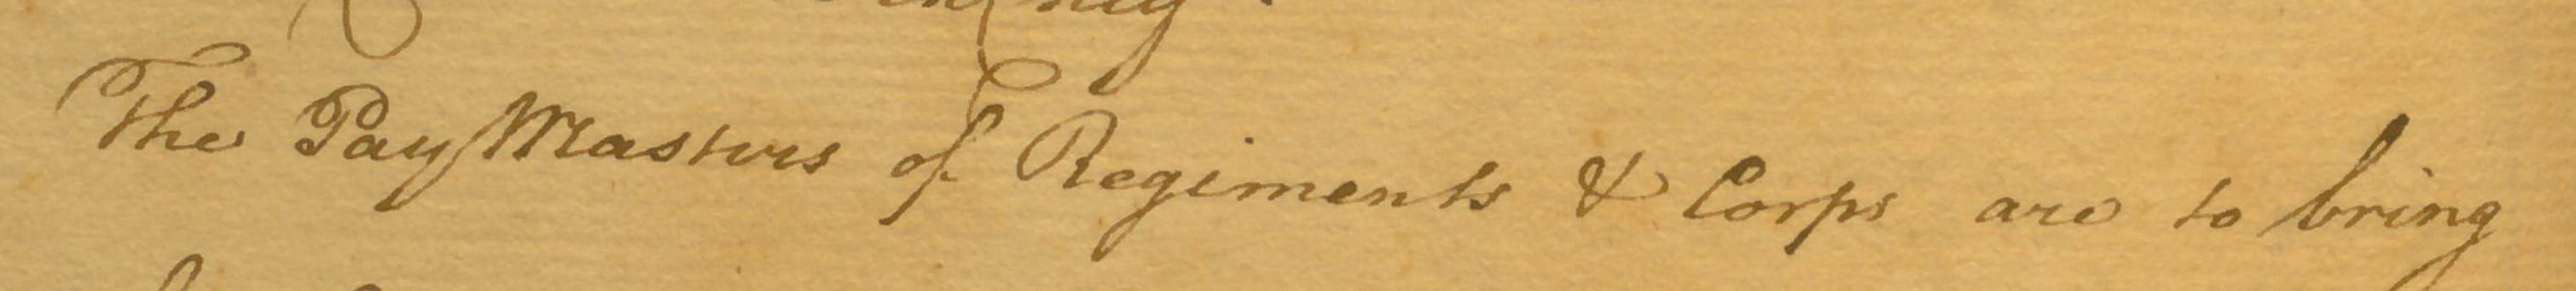The Pay Masters of Regiments & Corps are to bring
